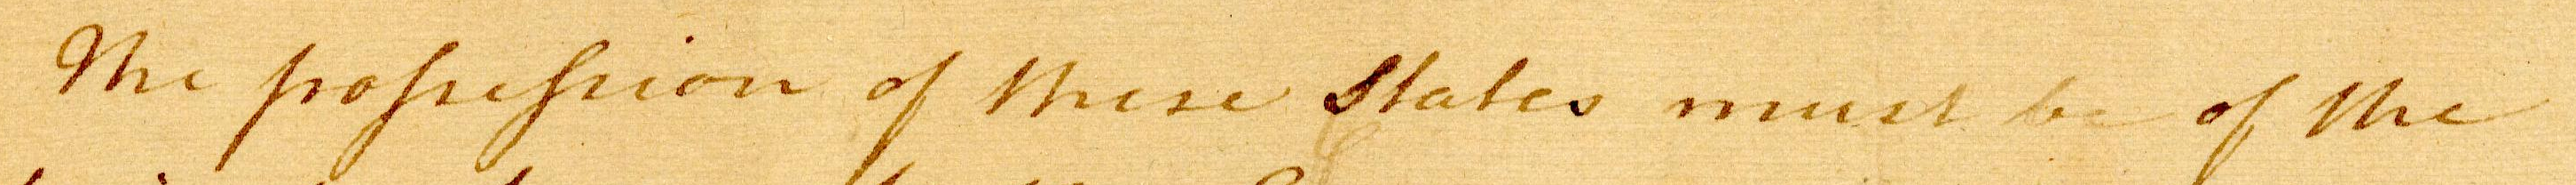The possession of these states must be of the
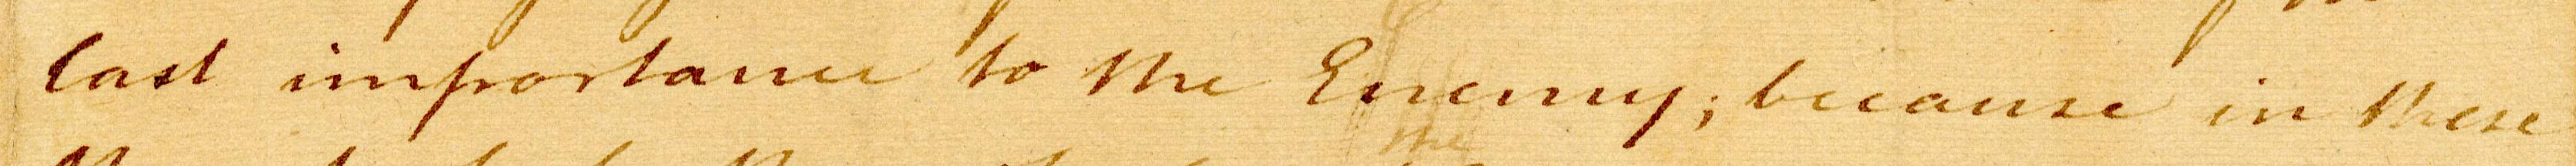last importance to the Enemy; because in these
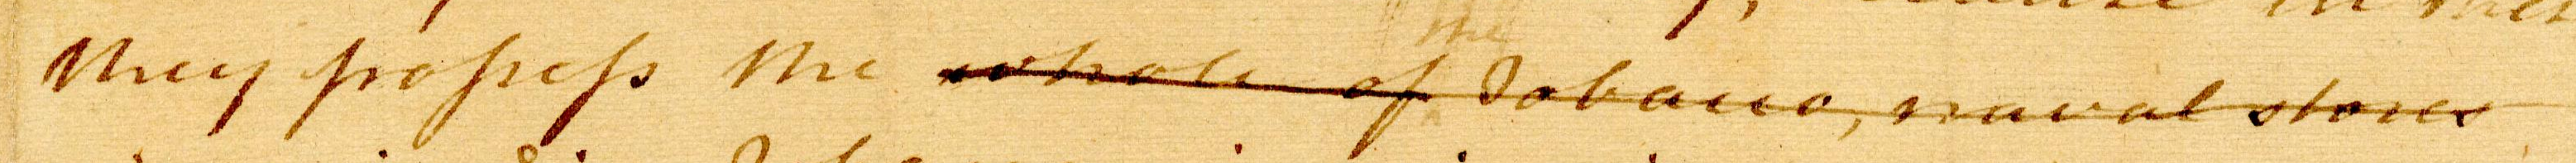they possess the [whole of tobacco, naval stores]
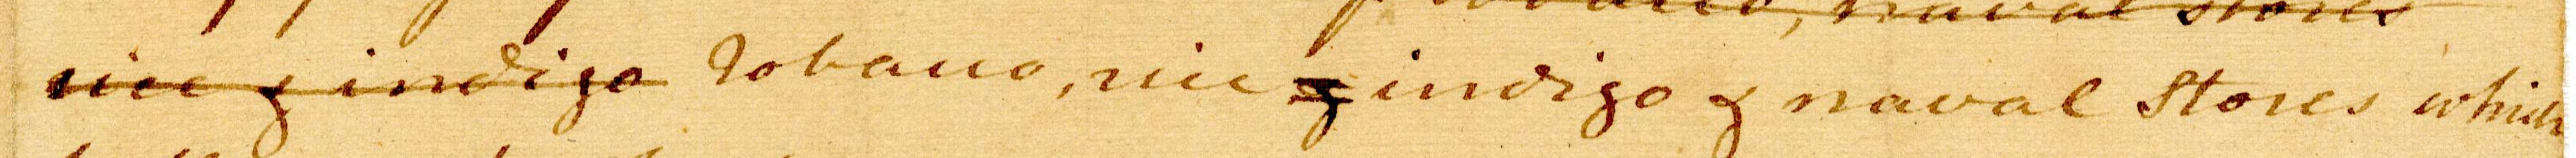[rice & indigo] tobacco, rice [&] indigo & naval stores which
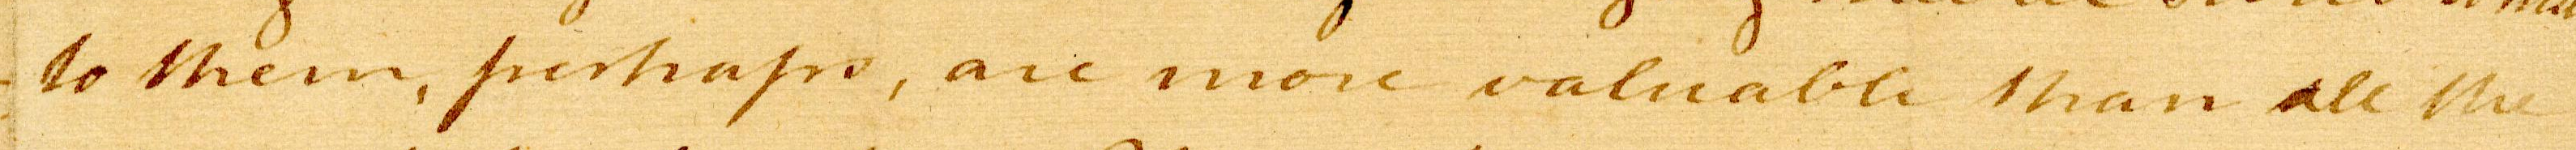to them, perhaps, are more valuable than all the
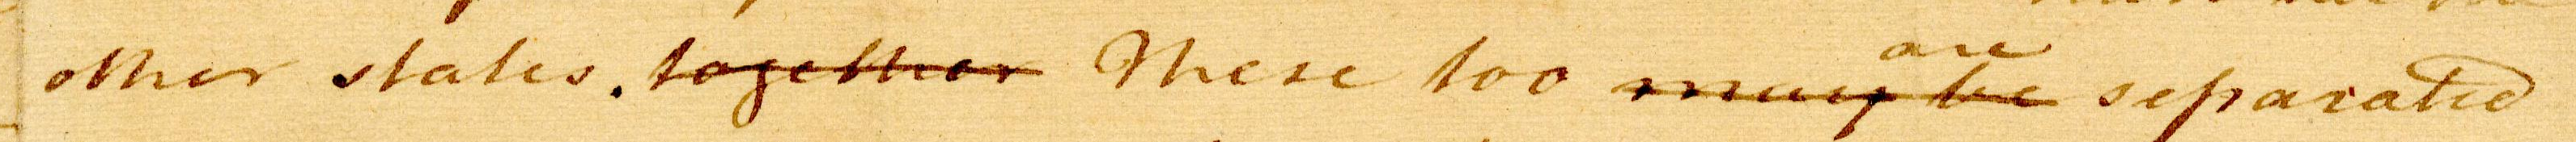other states, [together] these too [may be] separated
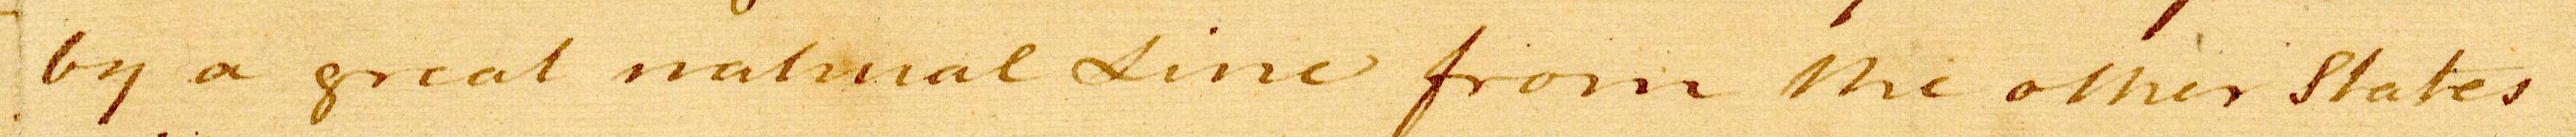by a great natural Line from the other states
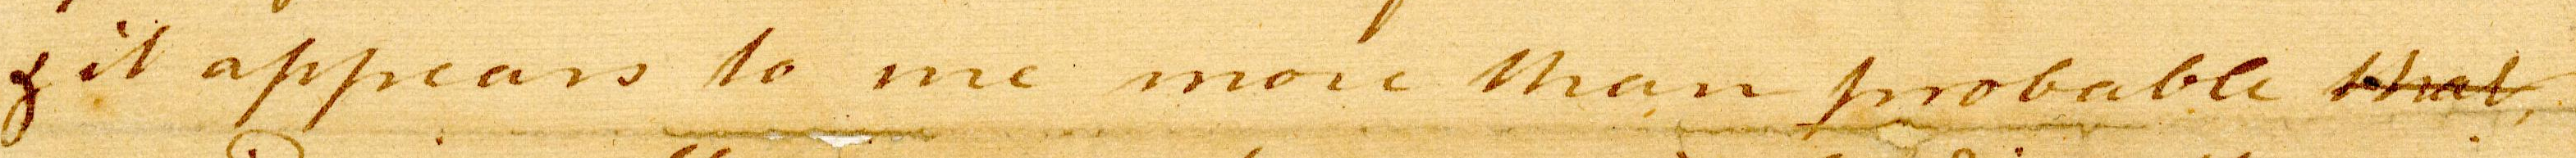& it appears to me more than probable [that]
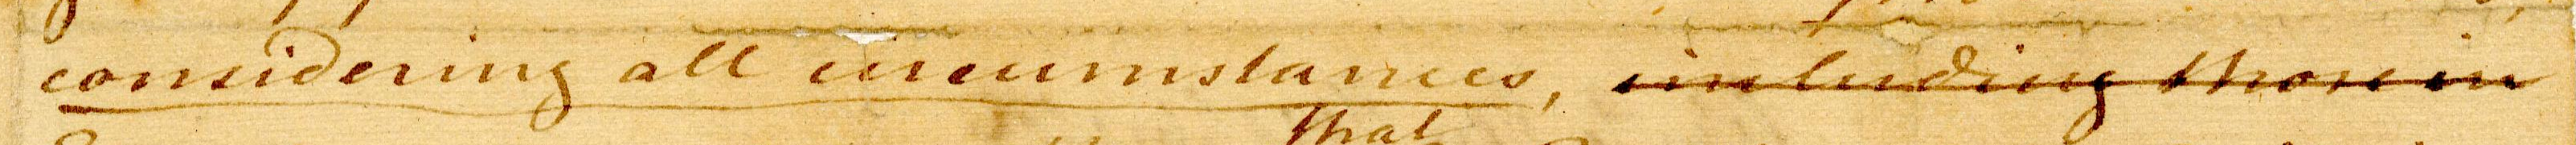considering all circumstances, [including those in]
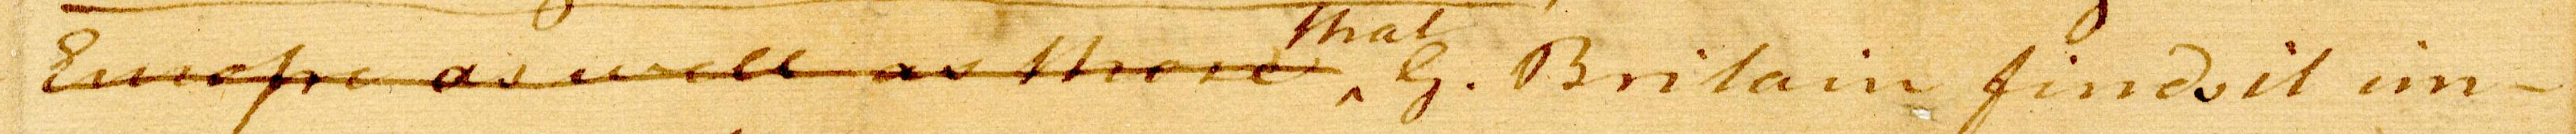[Europe as well as those] ^ G. Britain finds it im-
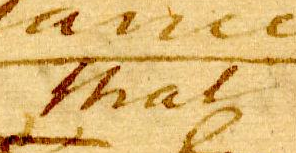that
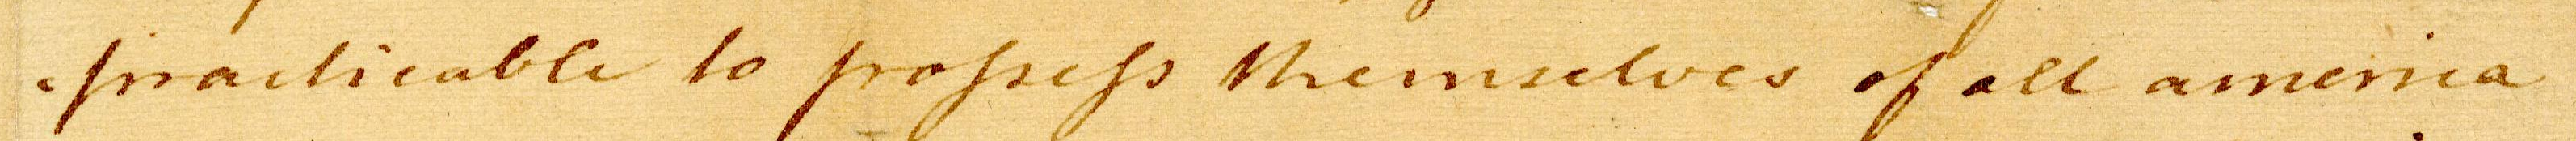practicable to possess themselves of all america
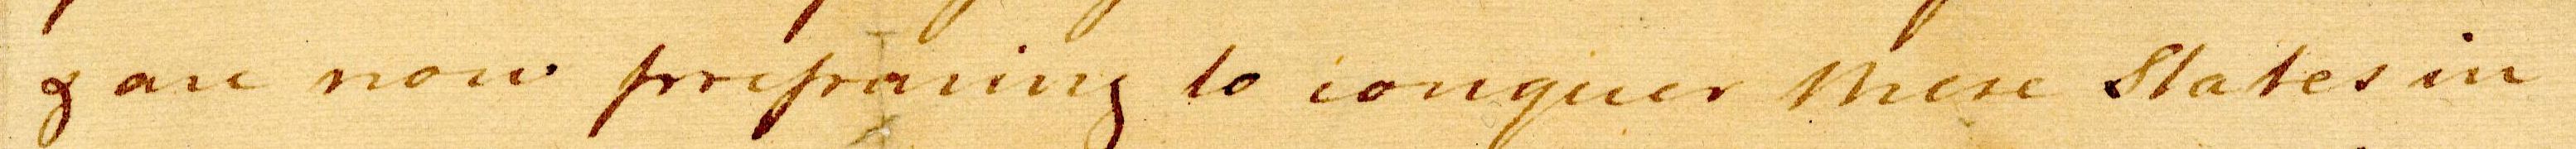& are now preparing to conquer these States in
